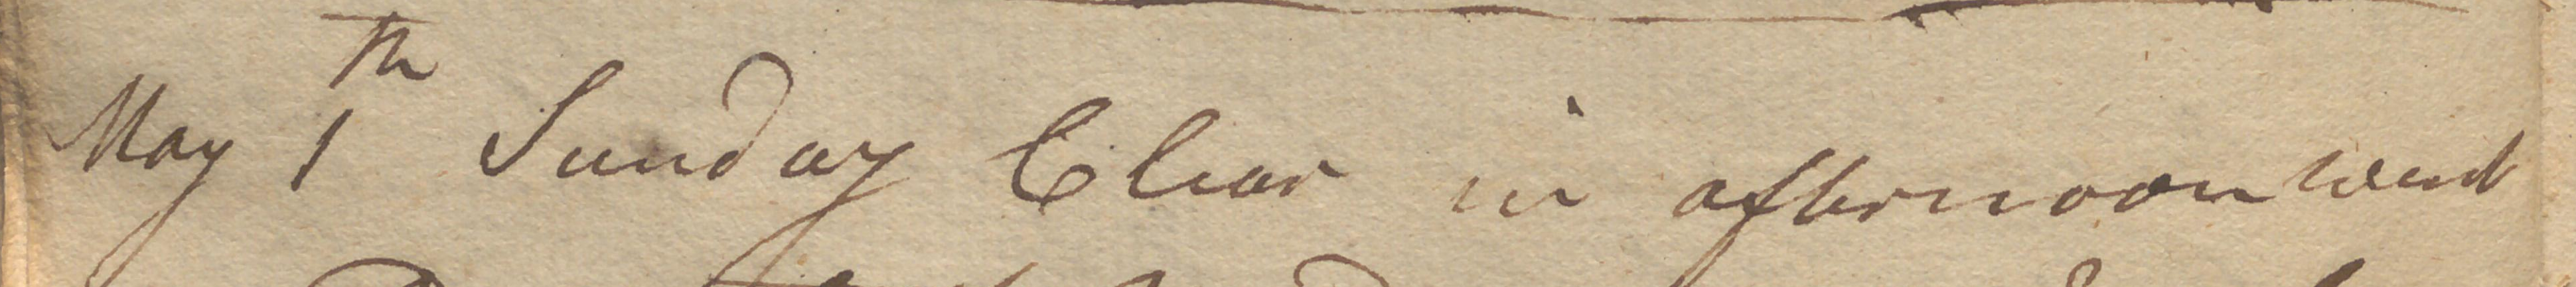May 1^th Sunday Clear in afternoon went
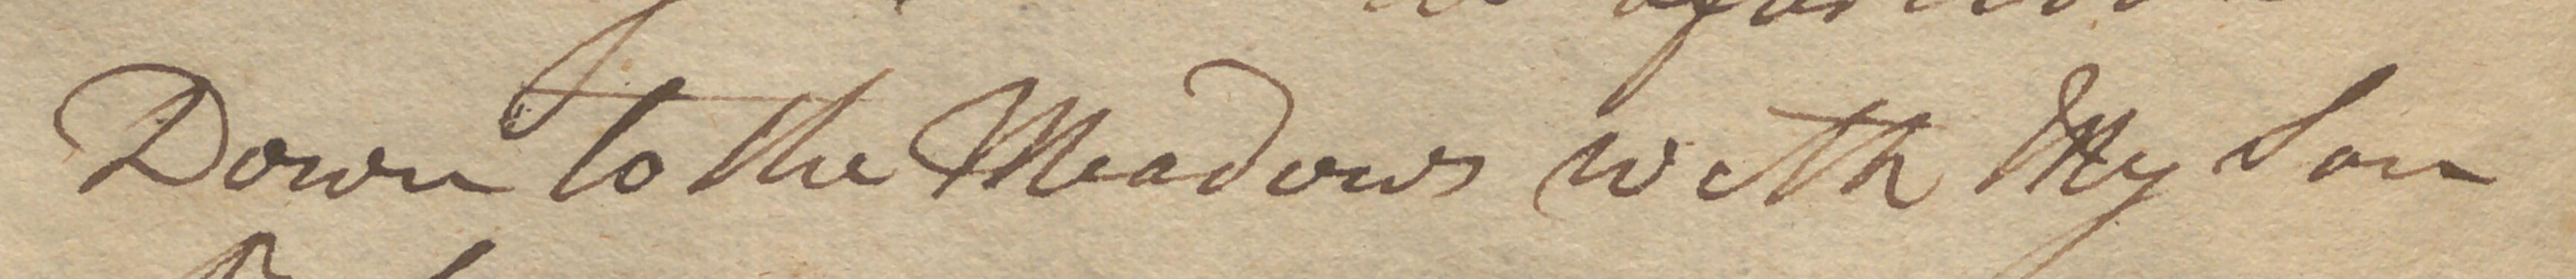Down to the Meadows with My Son
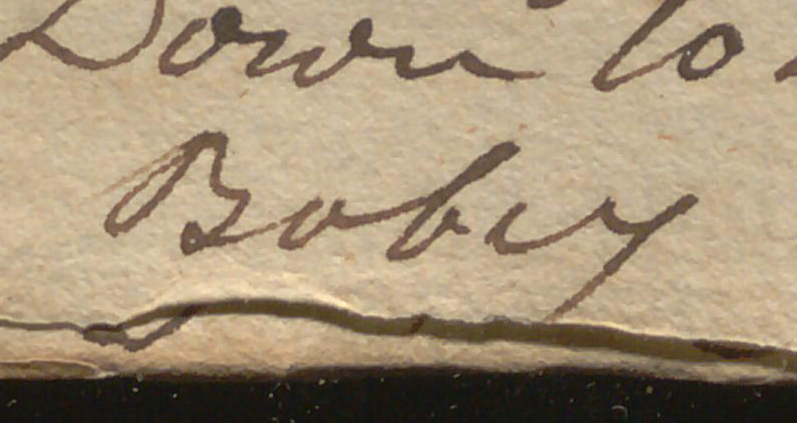Bobey
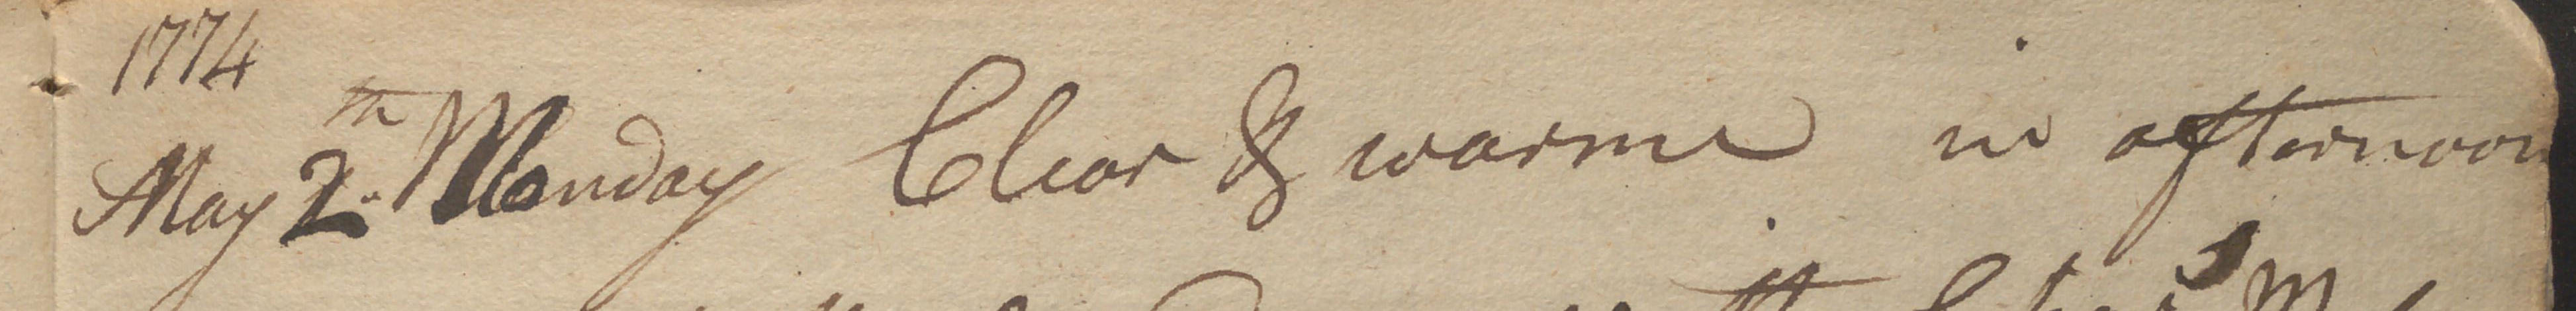May 2^th. Monday Clear & warme in afternoon
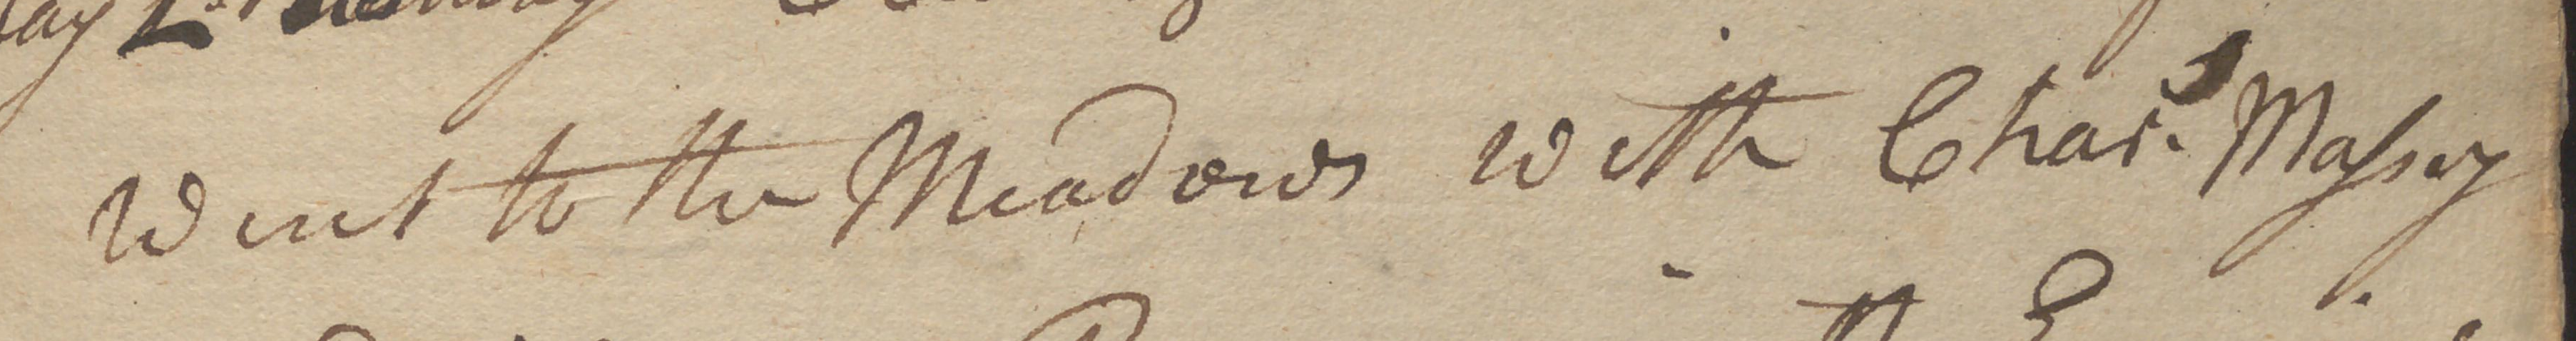went to the Meadows with Char^s. Massey
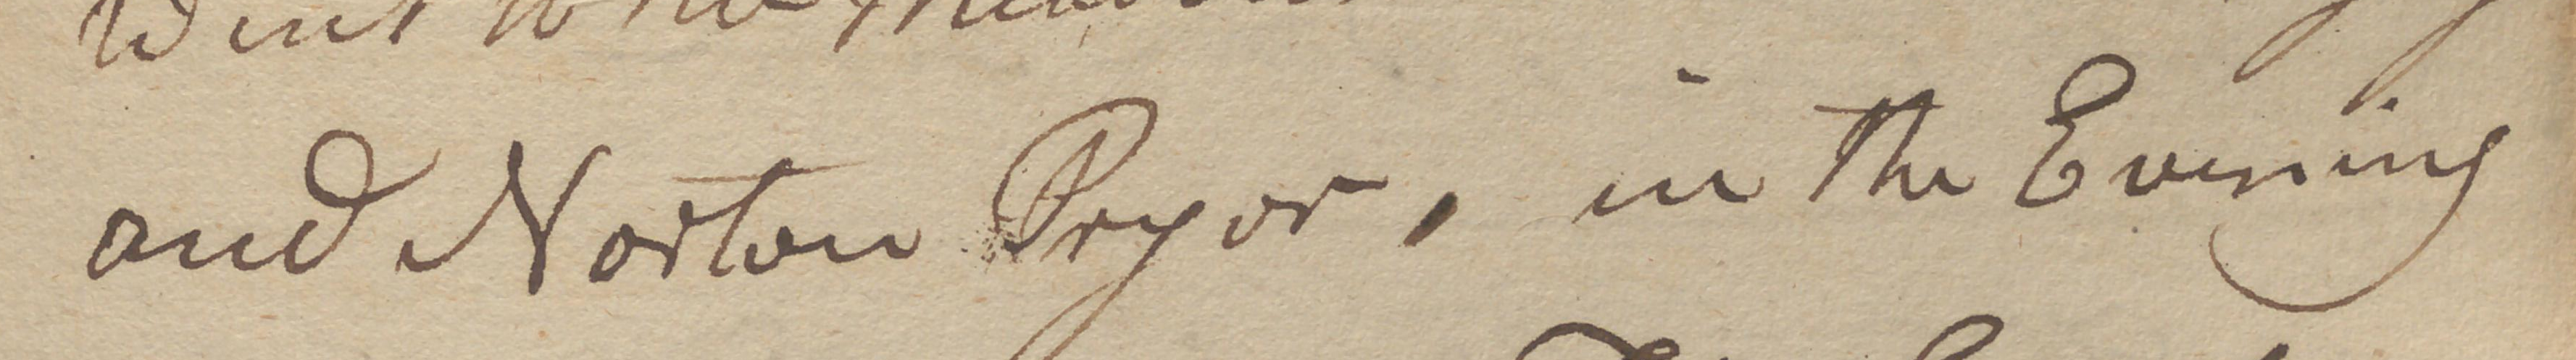and Norton Pryor, in the Evening
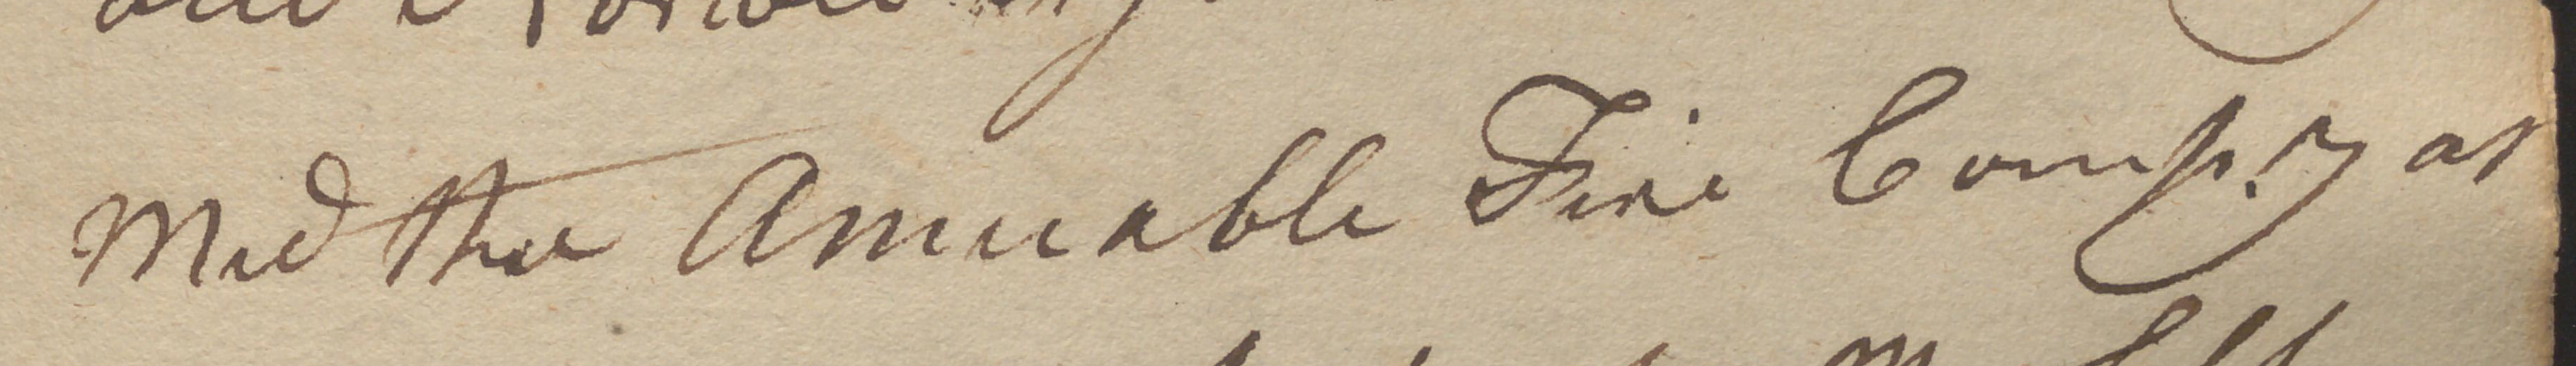med thee Amenable Fire Comp^y .at
